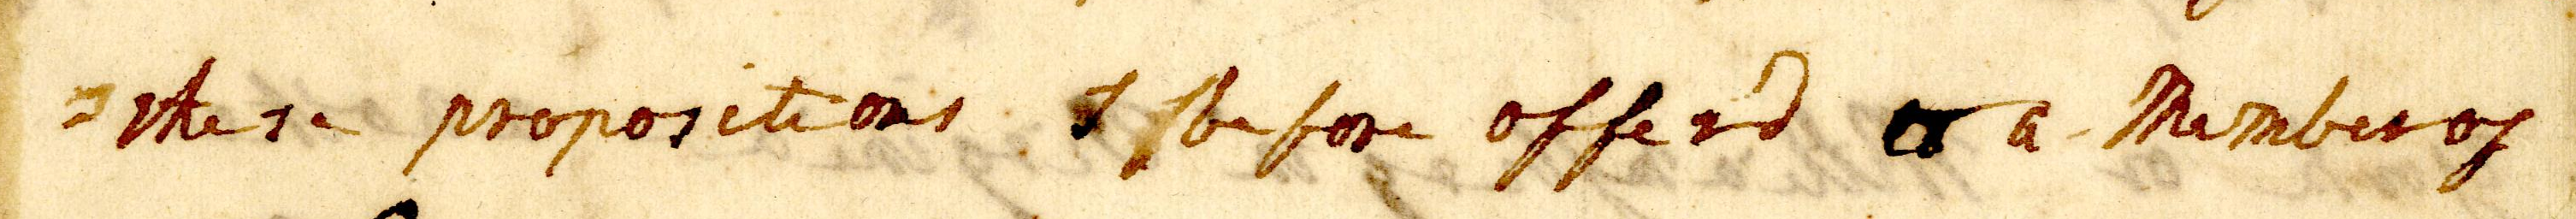these propositions & before offer'd to a Member of
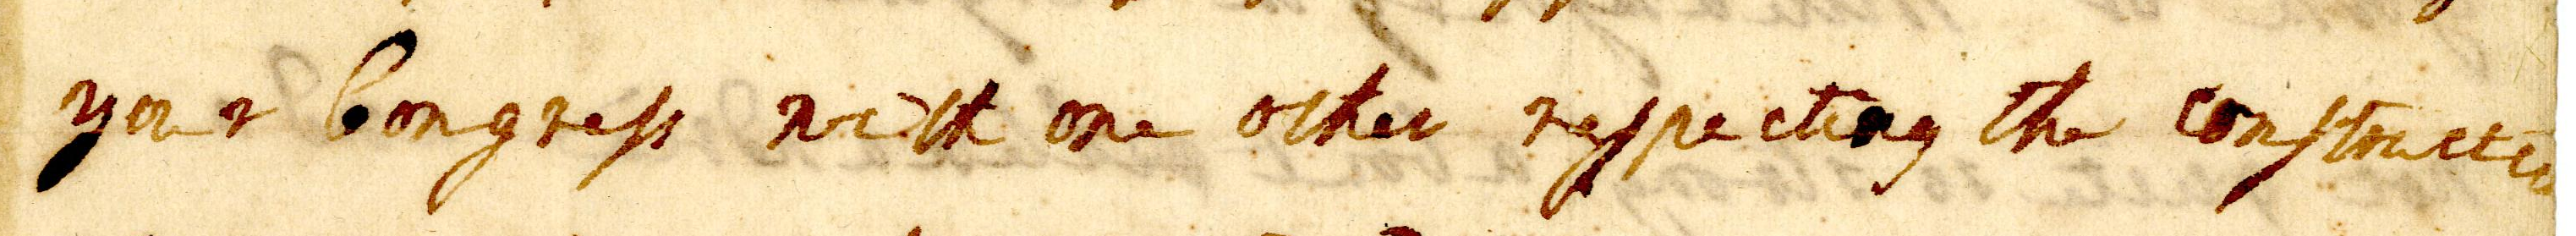your Congress with one other respecting the consecrate
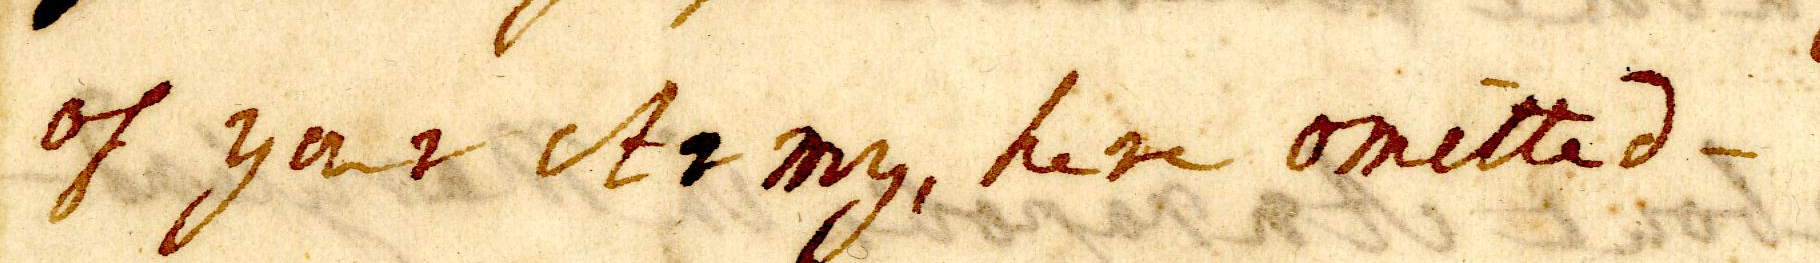of your itimy, here omitted-
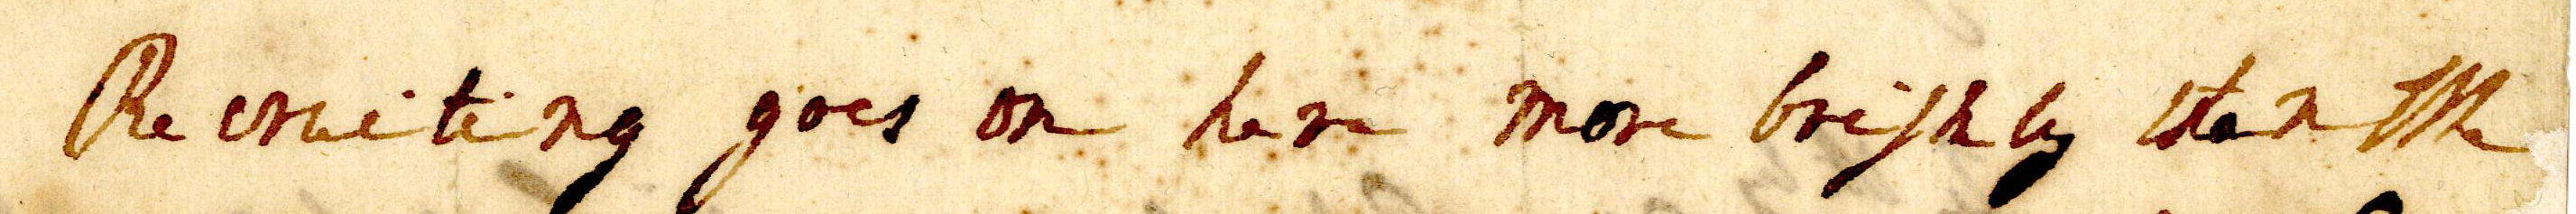Recruiting goes on here more brighly than the
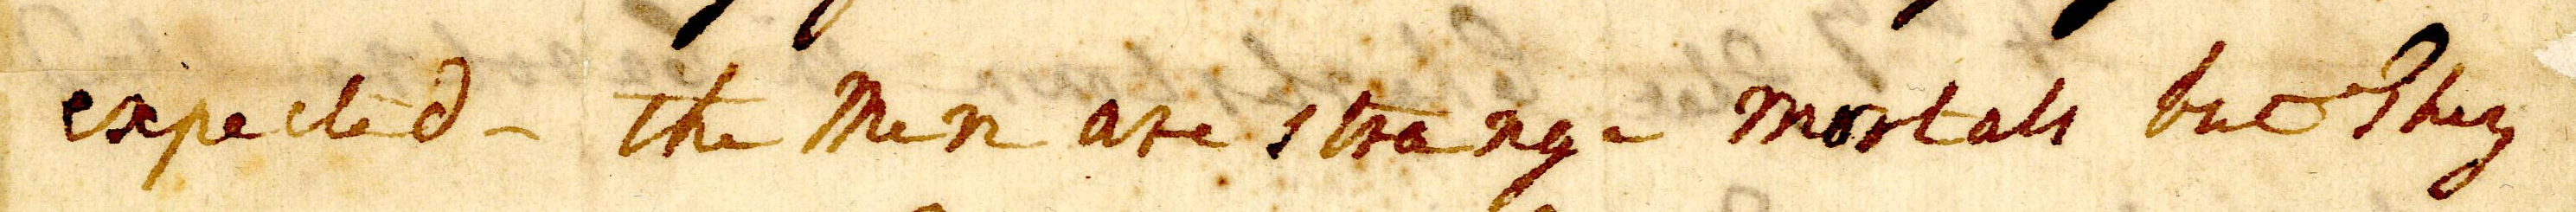expected- the men are strange mortals but They
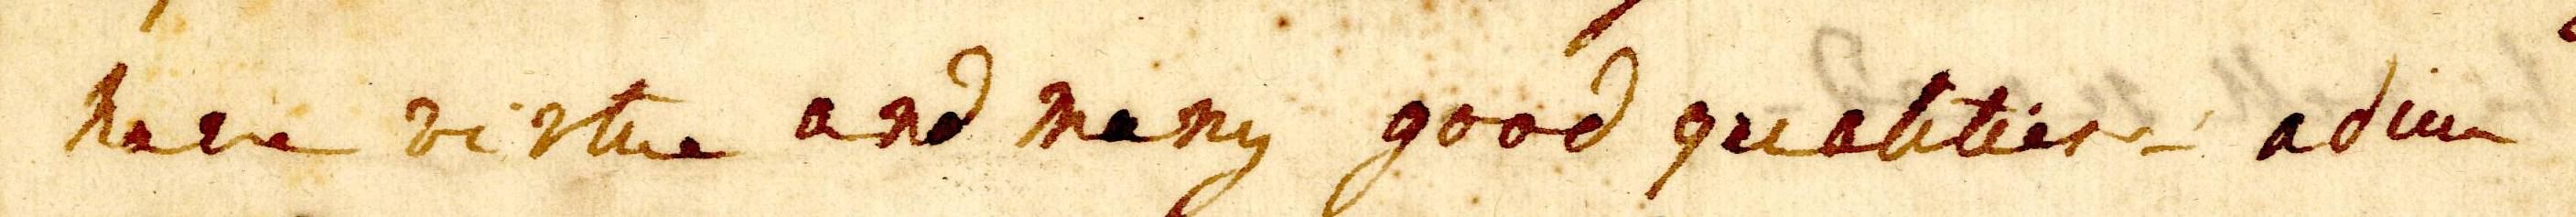have virtue and many good qualities- adieu
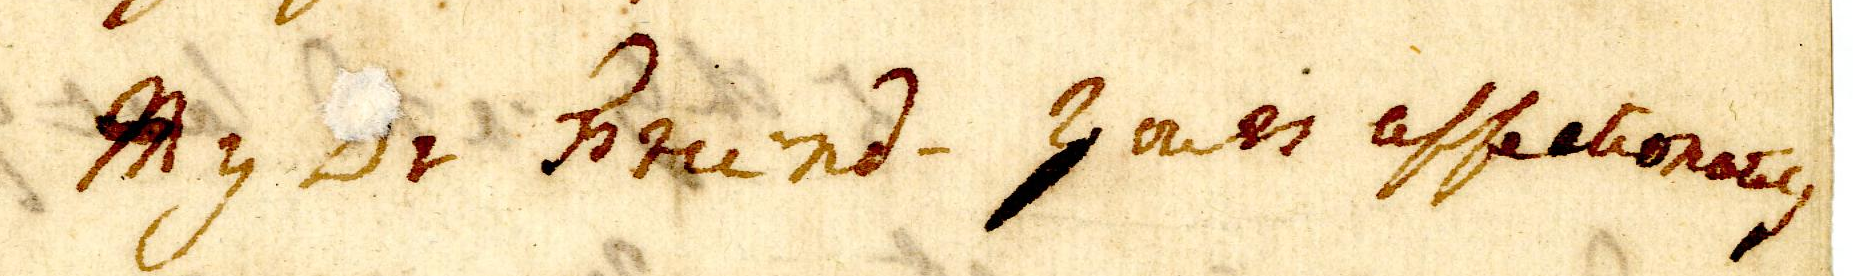My Dr Friend- yours affectionate
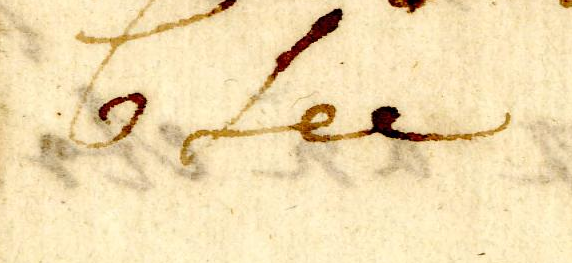C Lee
